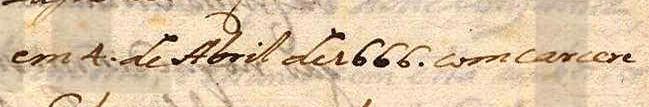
em 4. de Abril de 1666. com carcere
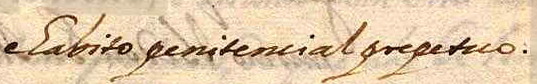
e habito penitencial prepetuo.
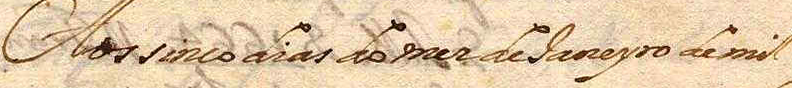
Aos sinco dias do mez de Ianeyro de mil
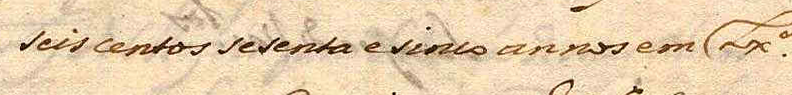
seiscentos sesenta e sinco annos em Lx.a
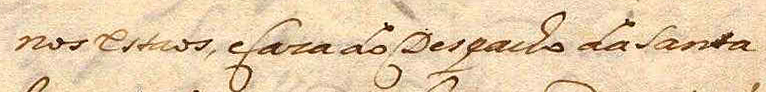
nos estaos, e Caza do Despacho da Santa
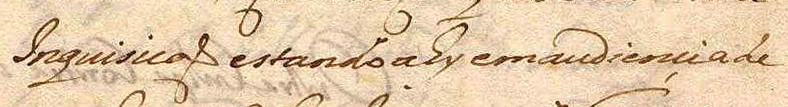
Inquisiçaõ estando ahy em audiencia de
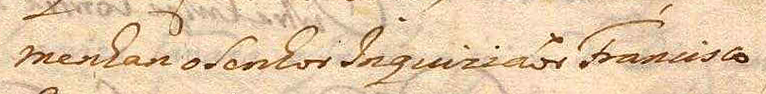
menhan o Senhor Inquizidor Francisco
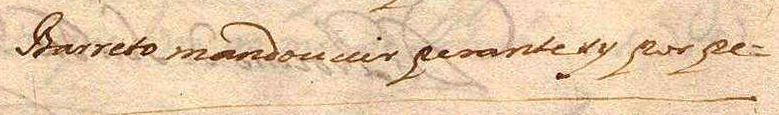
Barreto mandou uir perante sy por pe
